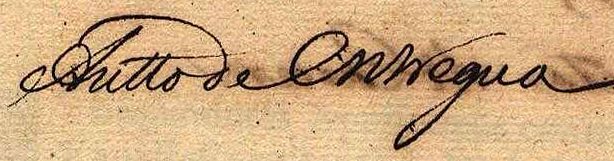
Autto de Entregua
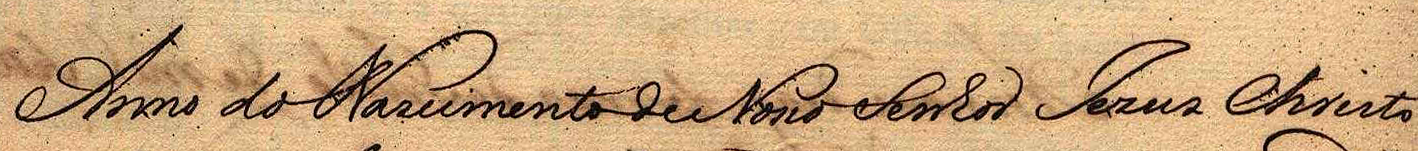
Anno do Nascimento de Nosso Senhor Iezuz Christo
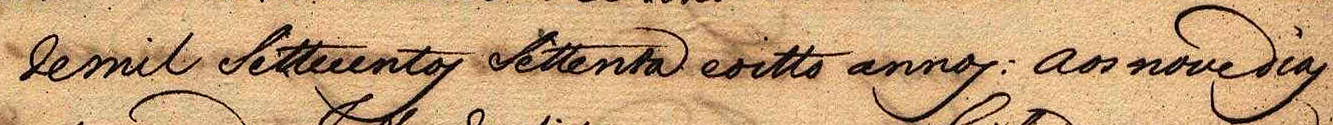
de mil Settecentos Settenta e oitto annos: aos nove dias
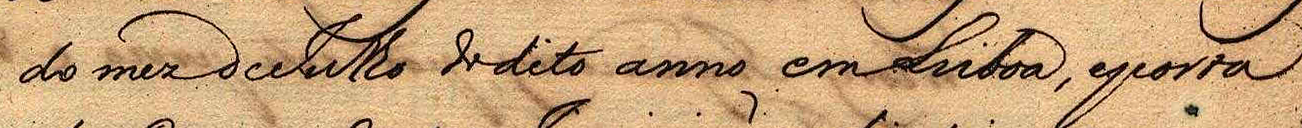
do mez de Iulho do dito anno em Lisboa, e porta
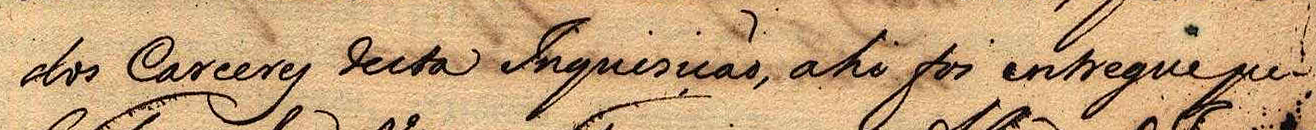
dos Carceres desta Inquisiçaõ, ahi foi entregue pe
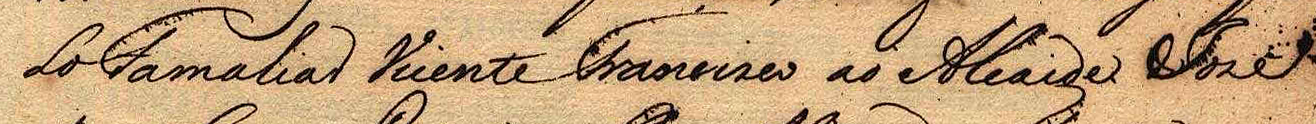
lo Famaliar Vicente Francisco ao Alcaide Iozé
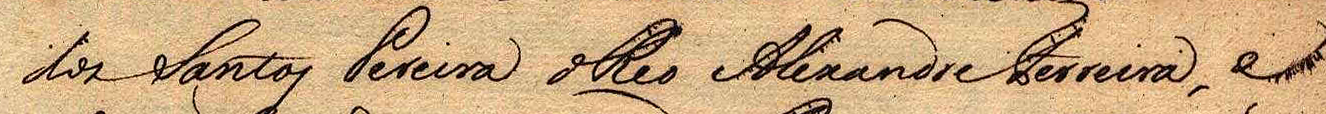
dos Santos Pereira o Reo Alexandre Ferreira, e
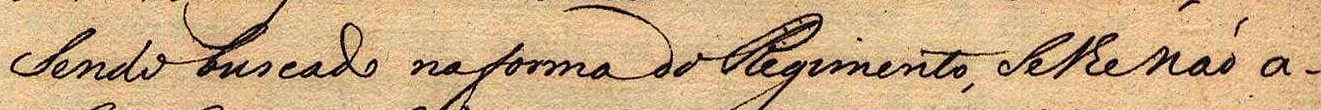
Sendo buscado na forma do Regimento, Se lhe não a
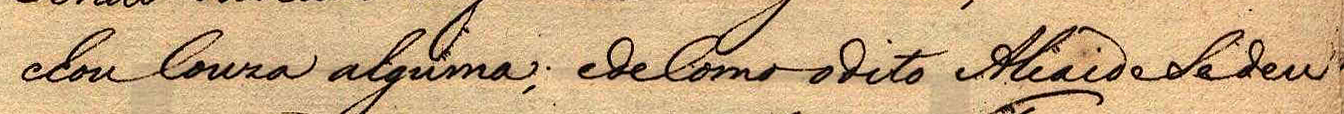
chou Couza alguma; e de Como o dito Alcaide Se deu
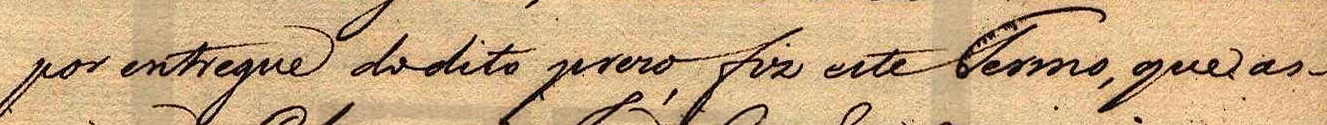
por entregue do dito prezo fiz este Termo, que as
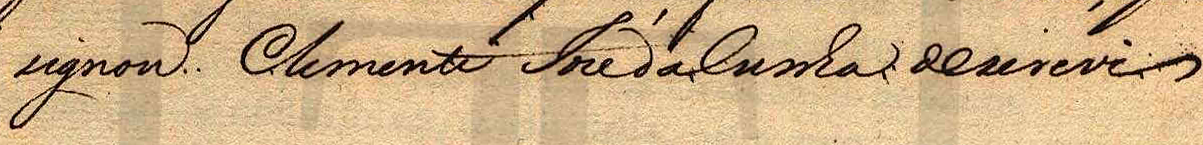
signou. Clemente Iozé da Cunha o escrevi
